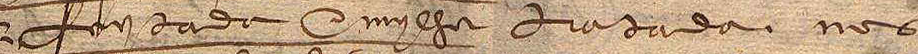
ēfeytada e mylhor tratada nos
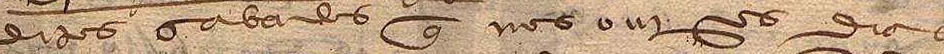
ditos sabados q̄ nos outos dias
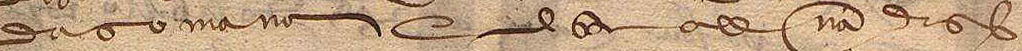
da somana e deste all nā dise
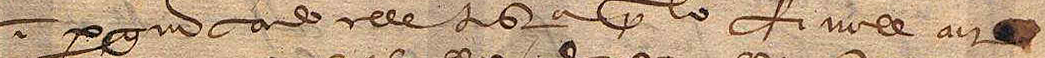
item ꝑgun̄tado elle testa p̄lo finall arto
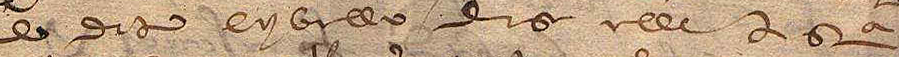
do dito lybello dise elle testa
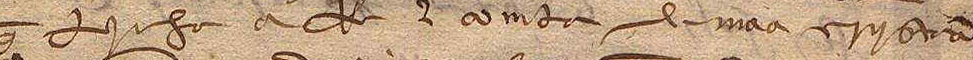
q̄ tynha a Re ē comta de maa crystaā
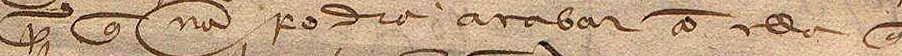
p̄oq̄ nā podia acabar c̄o ella q̄
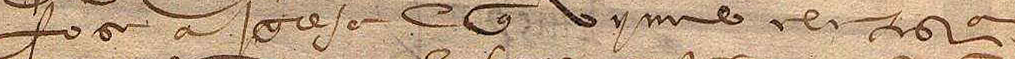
fose a JgreJa e q̄ vymdo elle testa
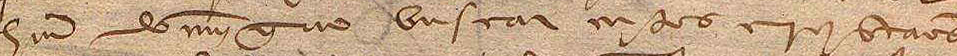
hū domȳguo buscar certos crystaõs
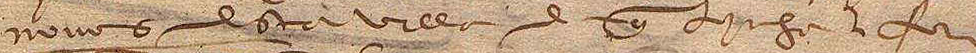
nouos desta villa de q̄ tynha ēfor
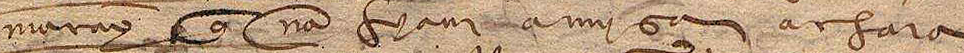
maçaõ q̄ nā hyam a mysa achara
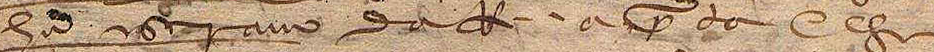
hū escrauo da Re a p̄ota e lhe
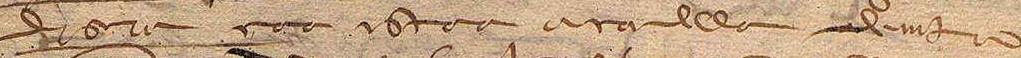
djsera caa estaa a cadella demtro
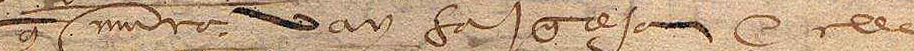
q̄ nūca vay ha JgreJa e elle
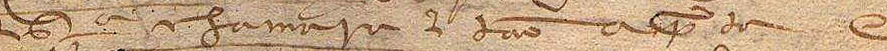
testa chamara ētaõ a p̄ota e
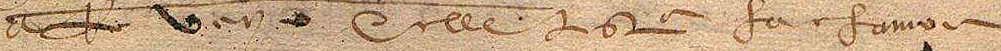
a Re veyo e elle testa ha chamou
